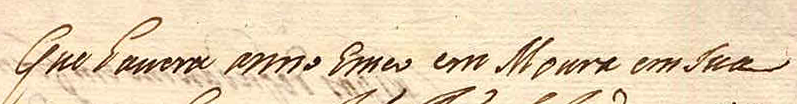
Que hauera anno E meo em Moura em sua
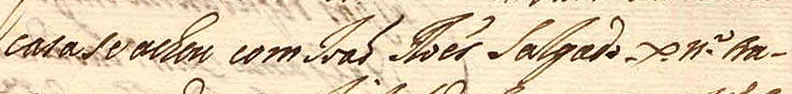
casa se achou com Ioaõ Roes̄ Salgado x. n.o tra
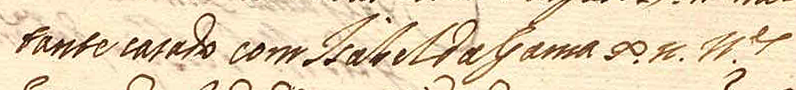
tante casado com Isabel da Gama x. n. N.es
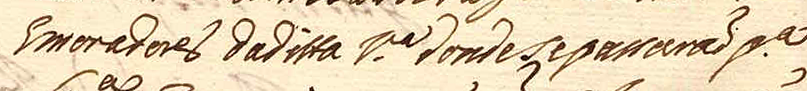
E moradores da ditta V.a donde se passaraõ p.a
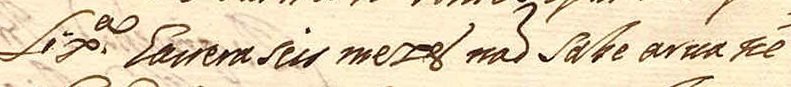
Lix.a hauera seis mezes naõ sabe a rua nē
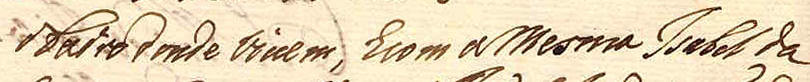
o bairo donde viuem, E com a mesma Isabel da
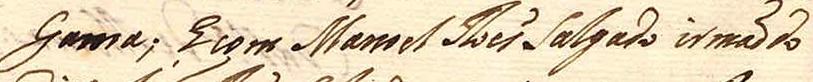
Gama; E com Manoel Roes̄ Salgado irmaõ do
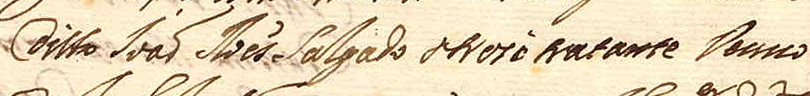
ditto Ioão Roes̄ Salgado otrosi tratante Veuuo
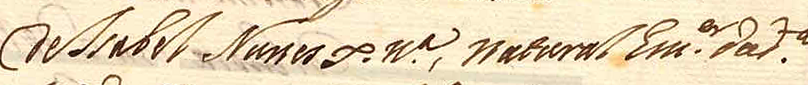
de Isabel Nunes x. n.a natural E m.or da d.a
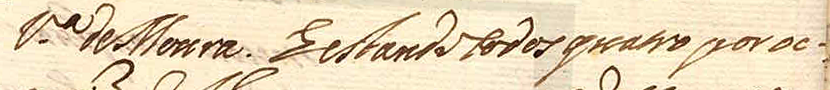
V.a de Moura. E estando todos quatro por oc
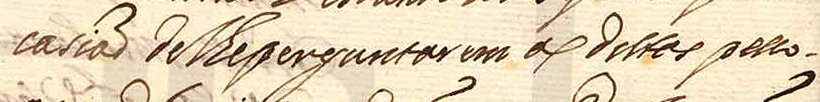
casiaõ de lhe perguntarem as dittas pesso
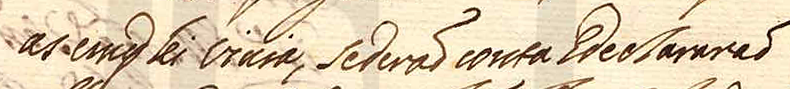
as em q̄ lei viuia, se deraõ conta E declararaõ
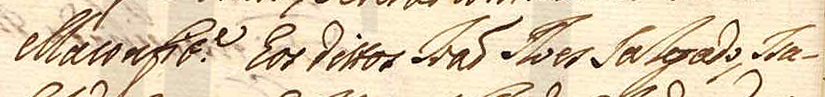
ella confit.e E os dittos Ioaõ Roes Salgado, Isa
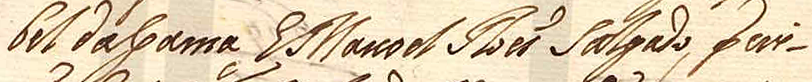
bel da Gama, E Manoel Roes̄ Salgado, q̄ cri
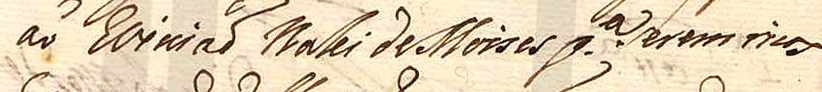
aõ E viuiaõ na lei de Moises p.a serem ricos
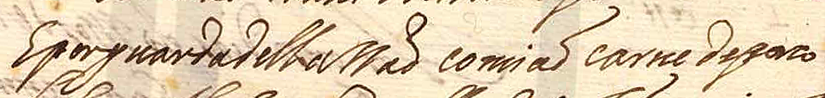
E por guarda della não comiaõ carne de porco
